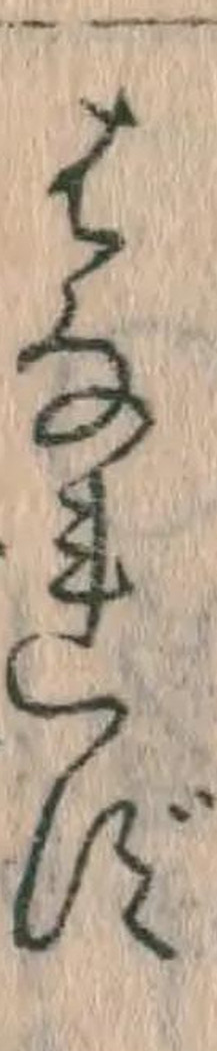はなれず
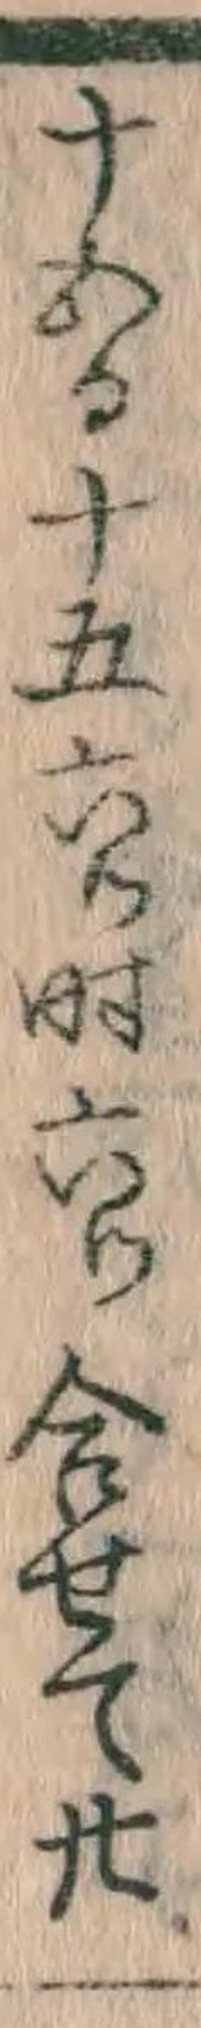十五日十五六ッ時六ッ合せて廿
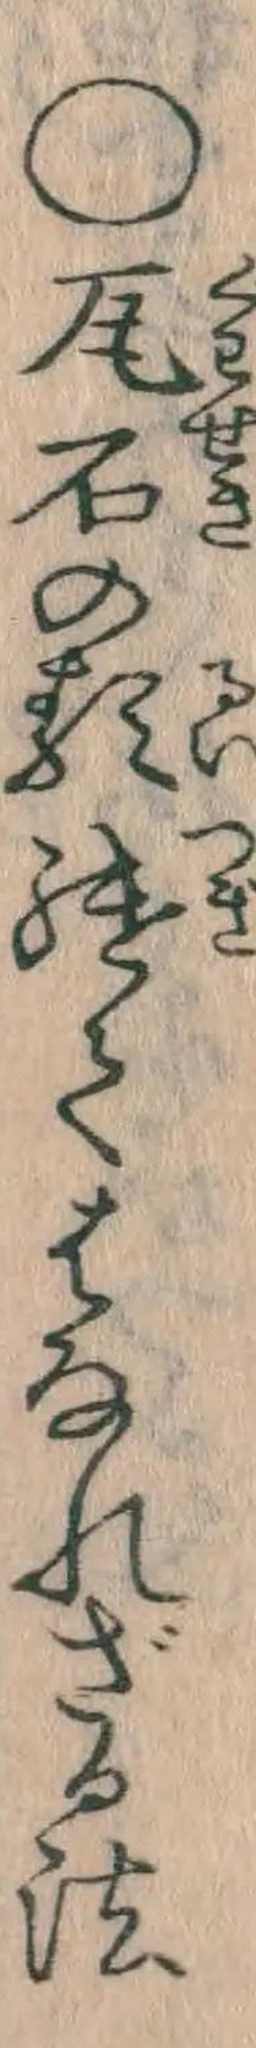○瓦石の類継てはなれざる法
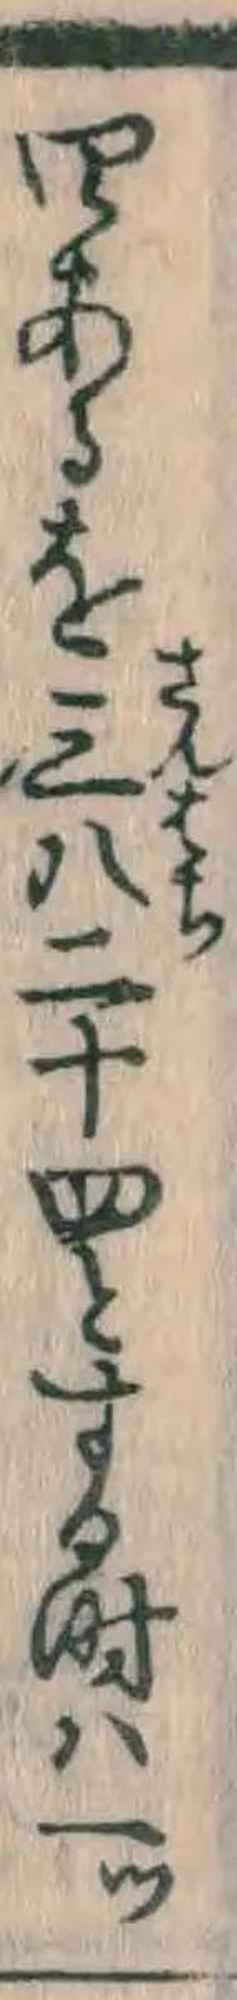四あるを三八二十四とする時は一ッ
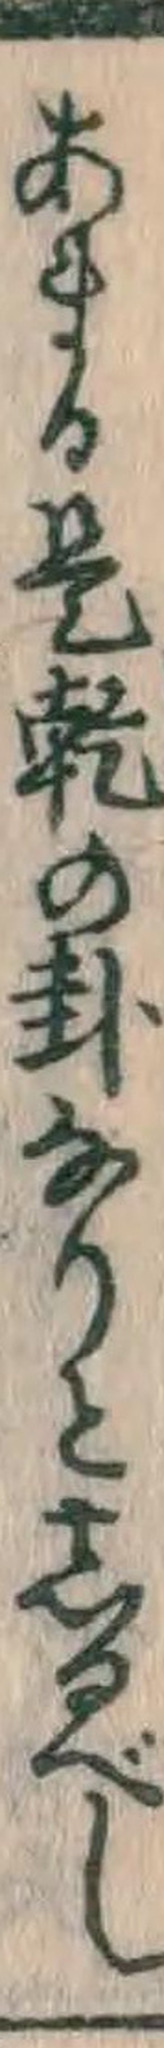あまる是乾の卦なりとしるべし
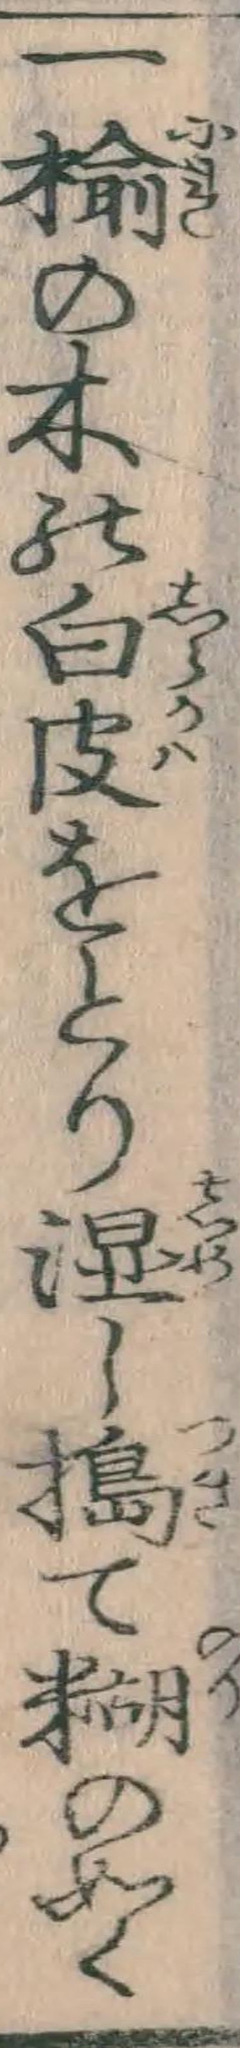一楡の木の白皮をとり湿し搗て糊の如く
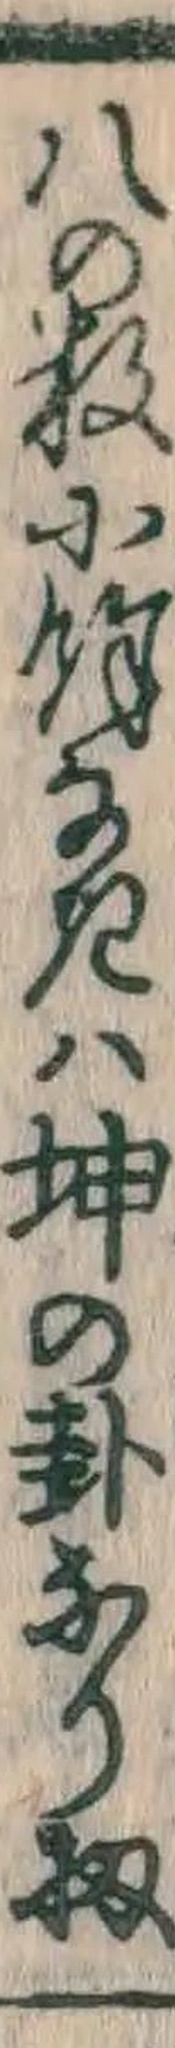八の数に余なきは坤の卦なり扨
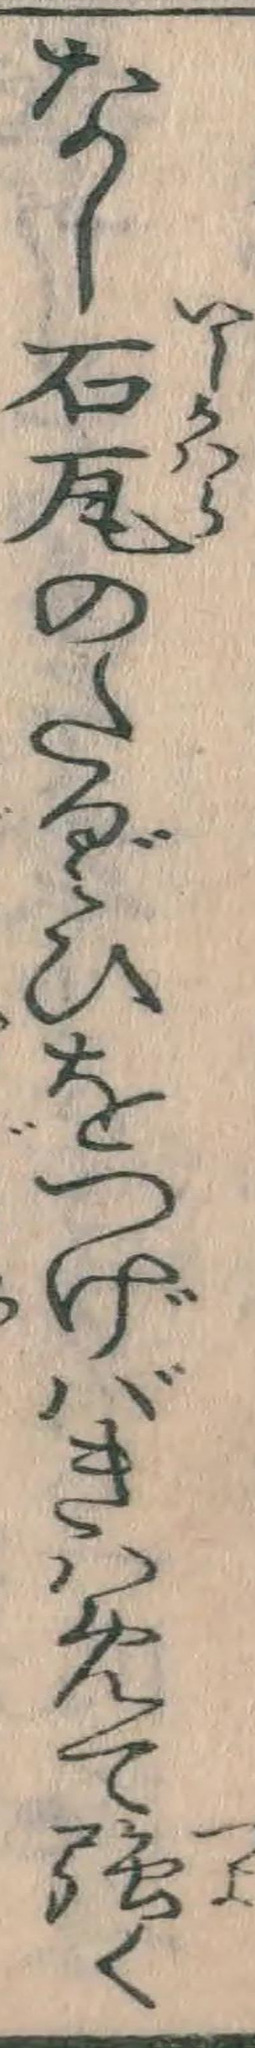なし石瓦のたぐひをつげばきはめて強く
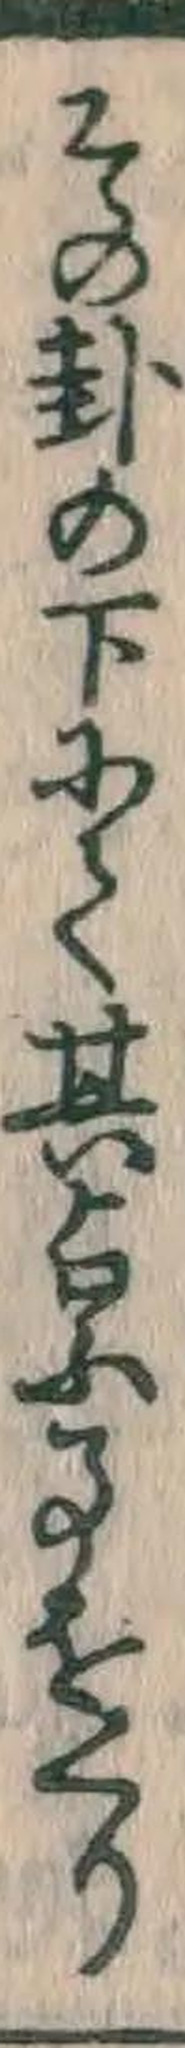その卦の下にて其占ふ事をくり
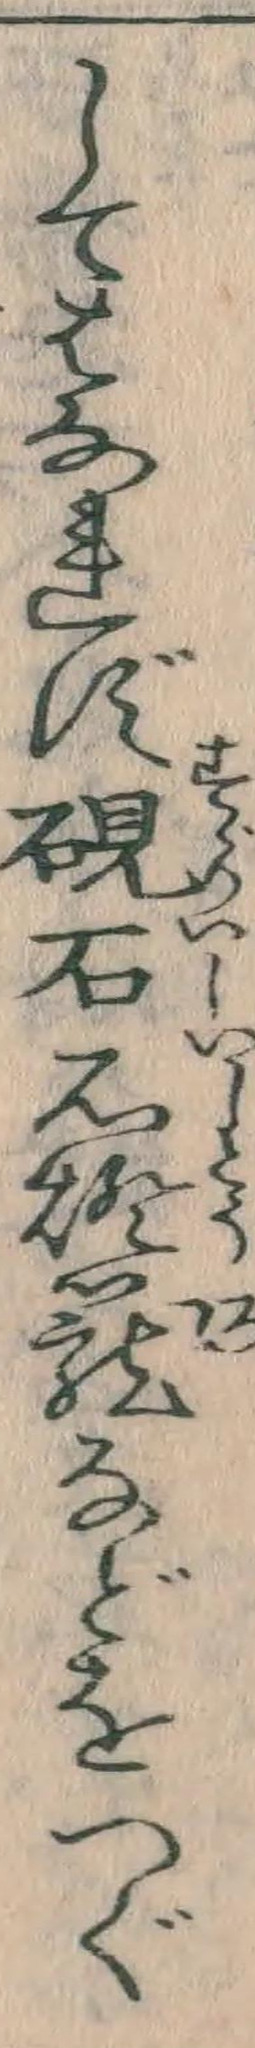してはなれず硯石石灯籠などをつぐ
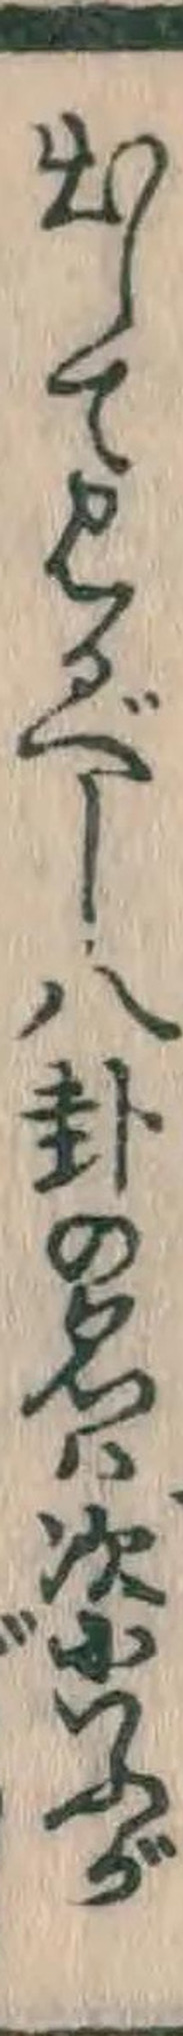出して見るべし八卦の名は次にいふが
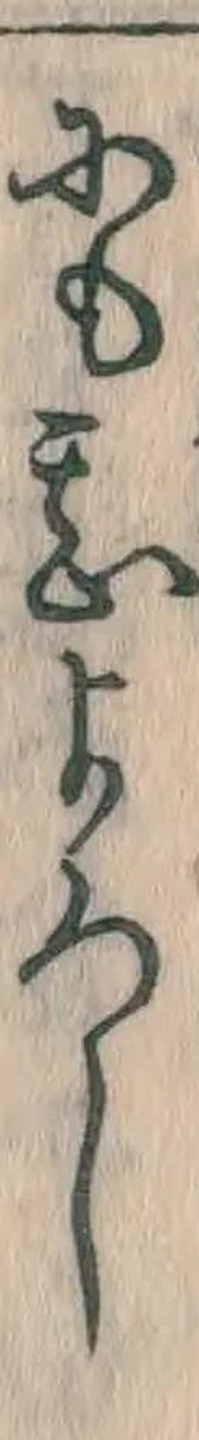にも甚よろし
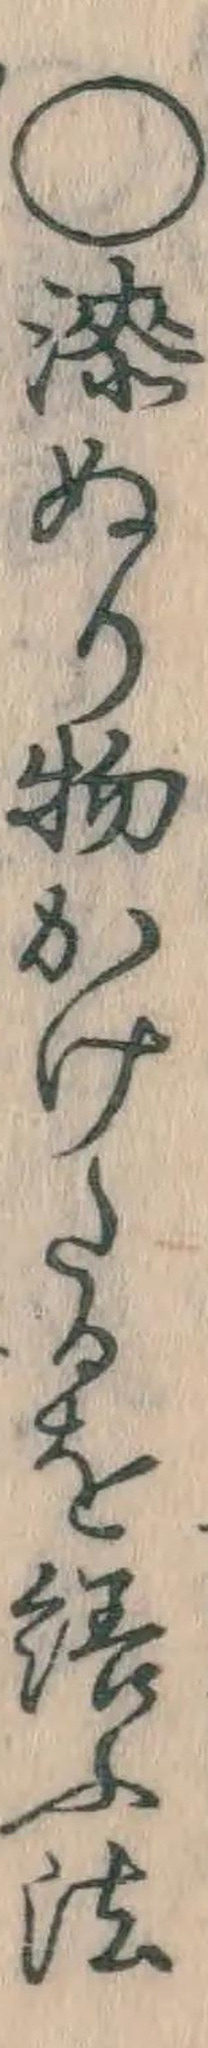○漆ぬり物かけたるを繕ふ法
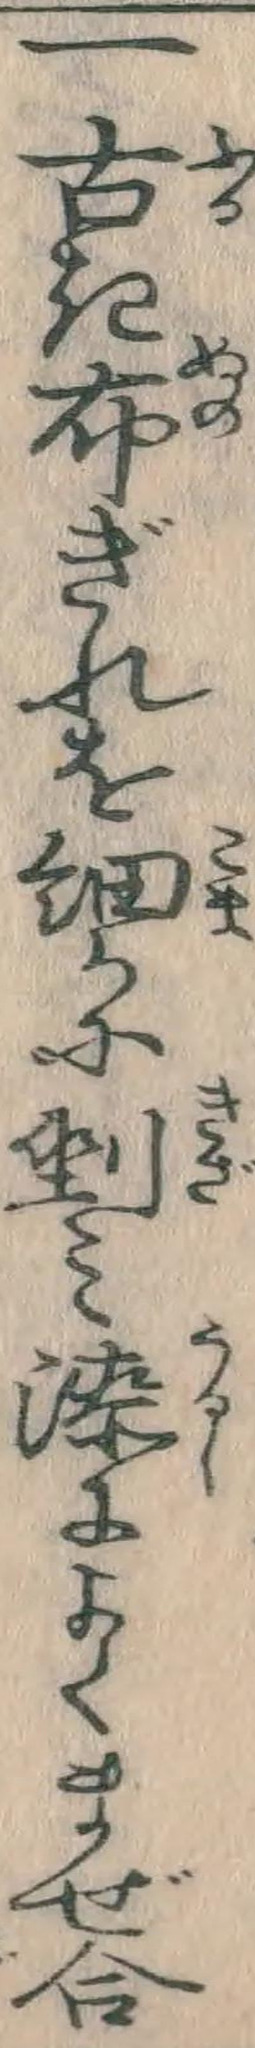一古き布ぎれを細かに剉み漆によくまぜ合
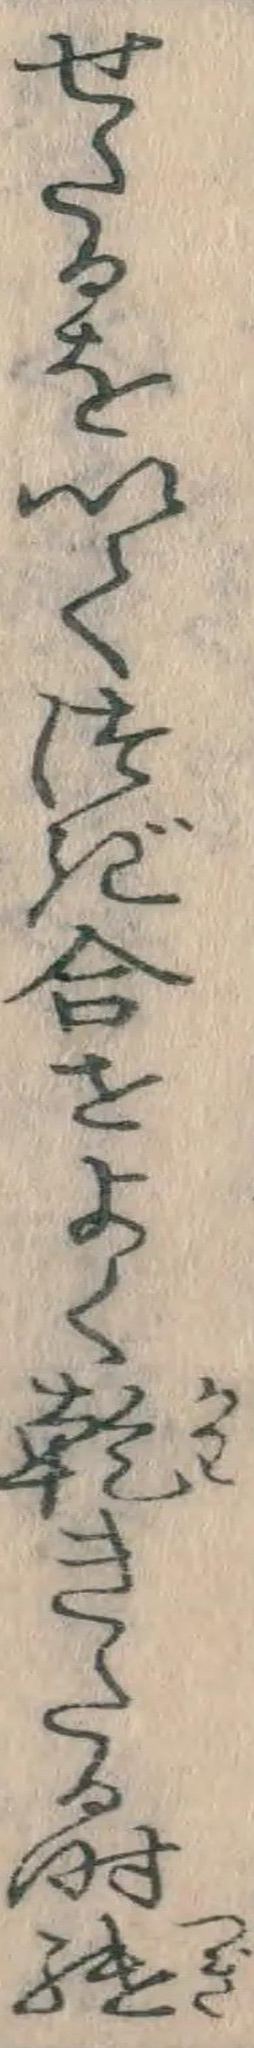せたるを以てつぎ合せよく乾きたる時継
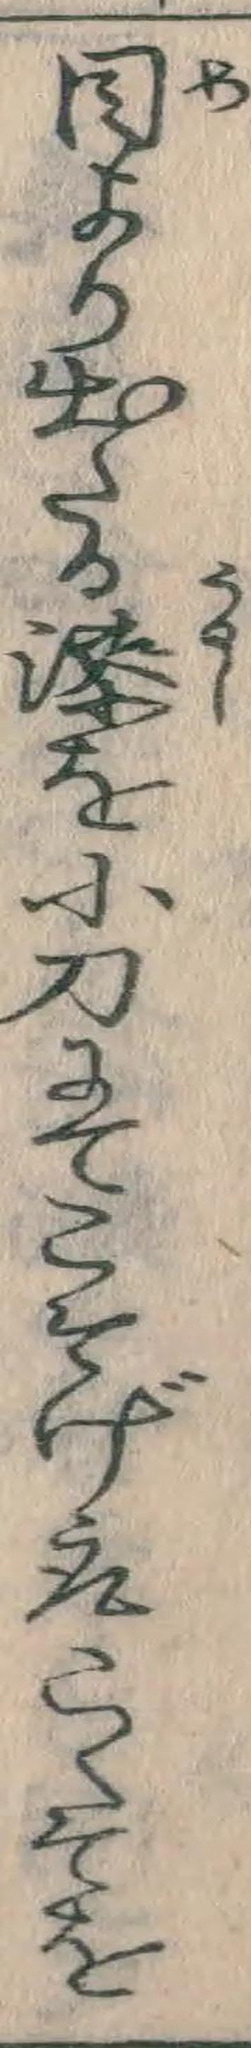目より出たる漆を小刀にてこそげ取こくそを
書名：広益秘事大全 3巻. [1]
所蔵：国立国会図書館 National Diet Library, JAPAN
